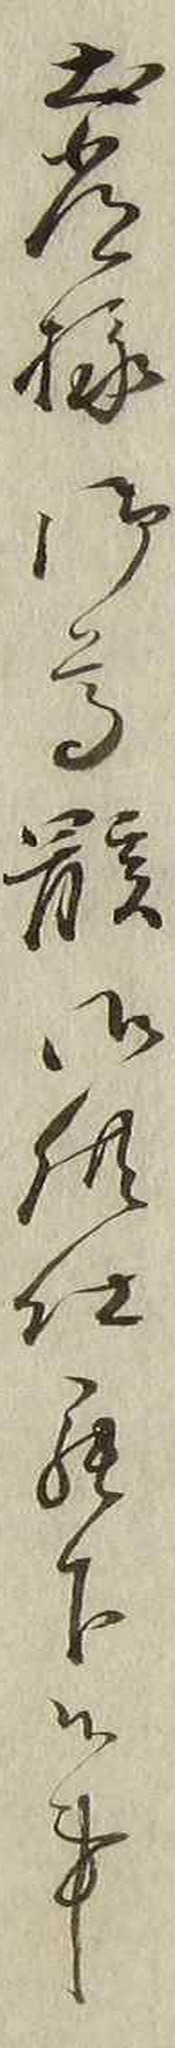土常様御尊骸御供仕り罷り候事
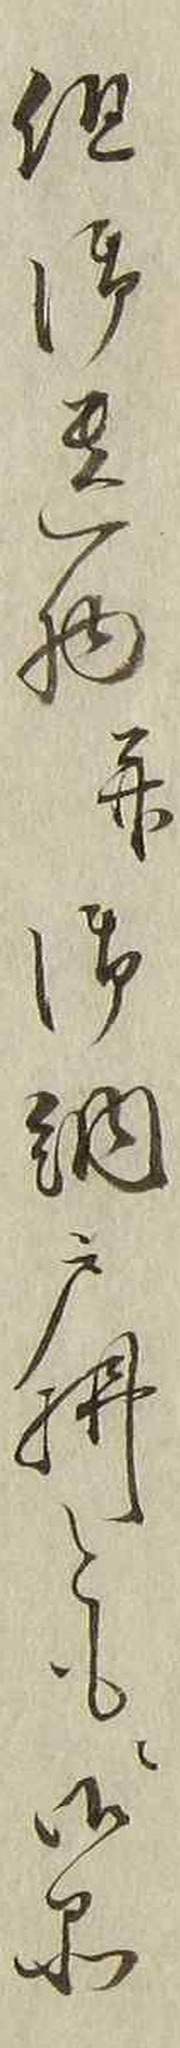但し御遺物幷御納戸拂いともニ御品
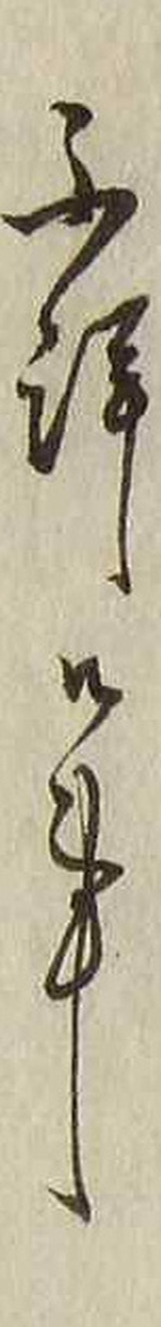不詳候事

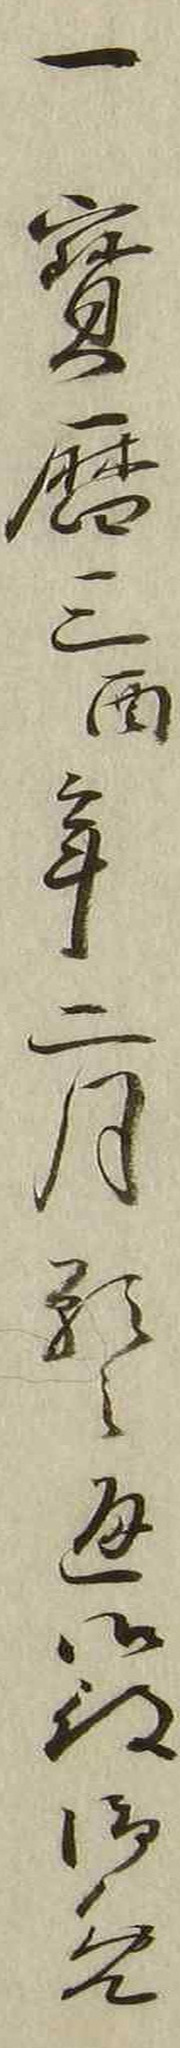一宝暦三酉年二月願い之通り御役御免
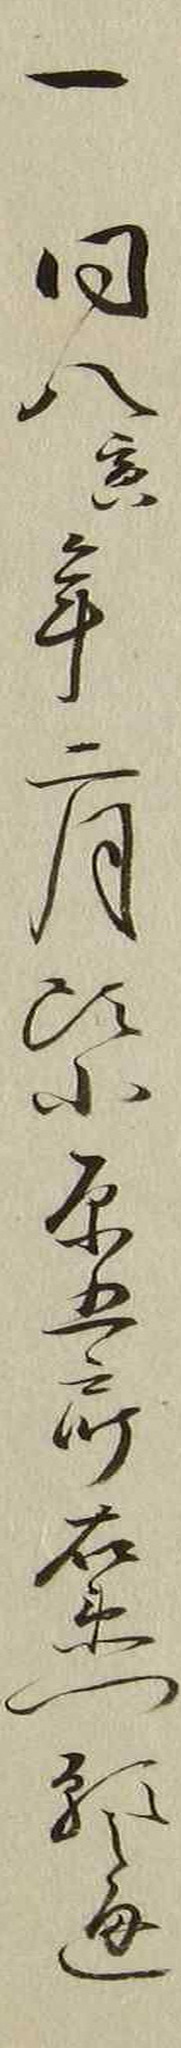一同八寅年二月頃小原五郎右衛門願い之通り
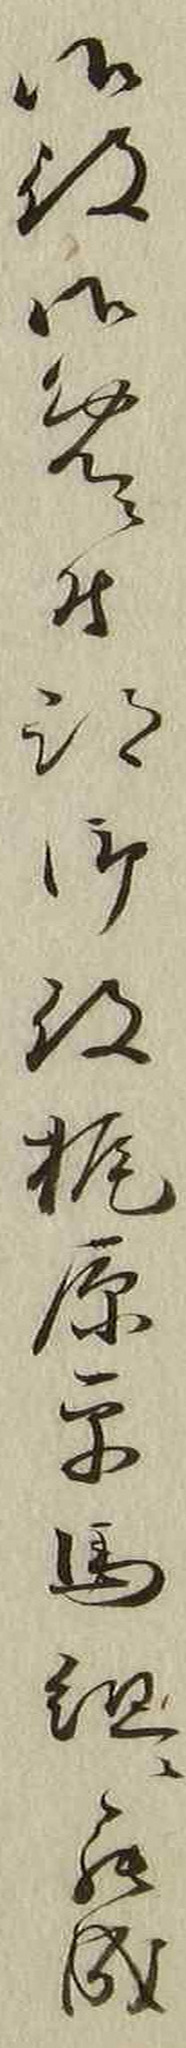御役御免ニ付き跡御役梶原平馬組ニ罷り成り
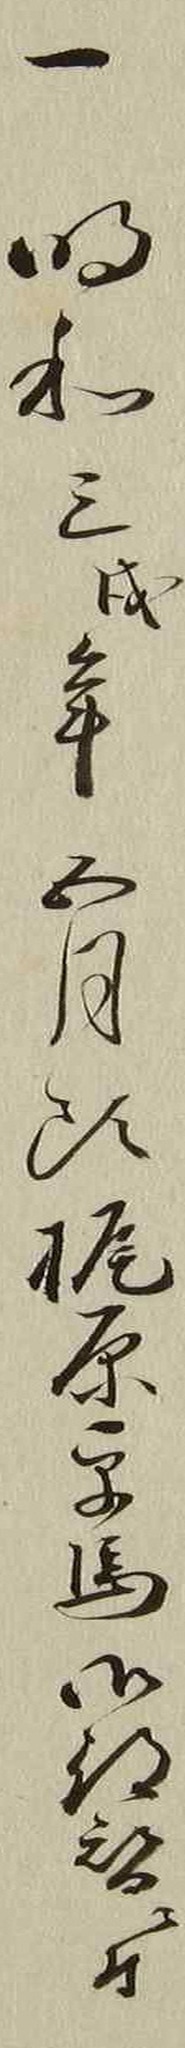一明和三戌年五月頃梶原平馬御役替えニ付き
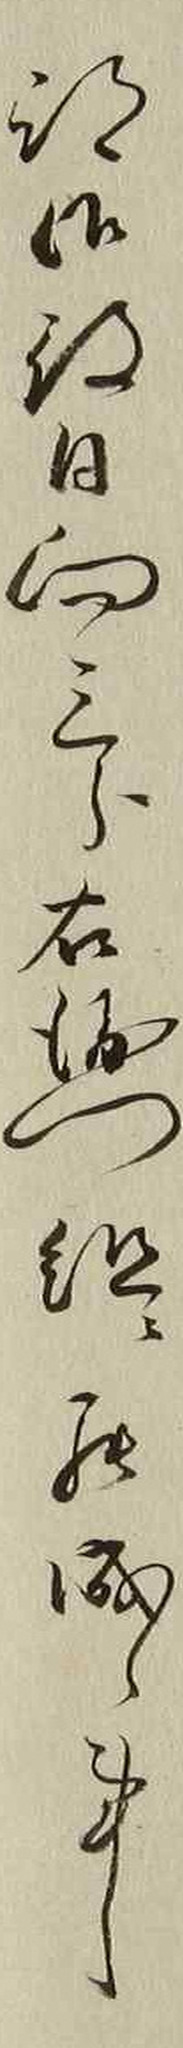跡御役日向三郎右衛門組ニ罷り成り候事
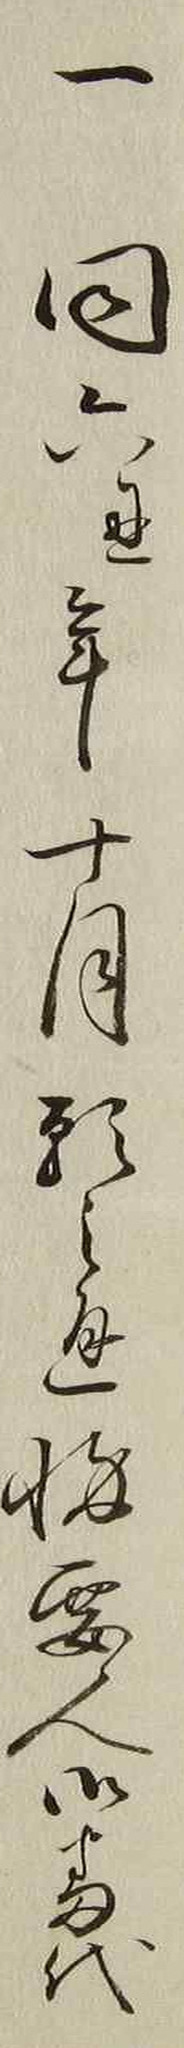一同六丑年十月願い之通り倅要人御番代
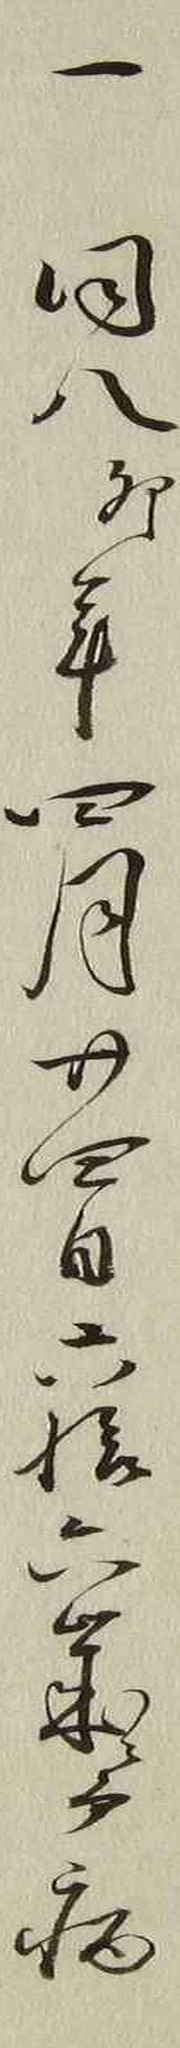一同八卯年四月廿四日六拾六歳ニて病
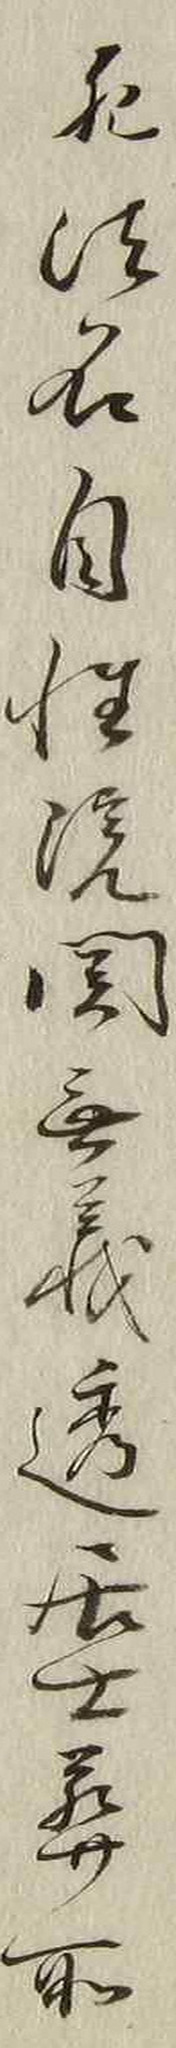死法名自性院関無義透居士葬所
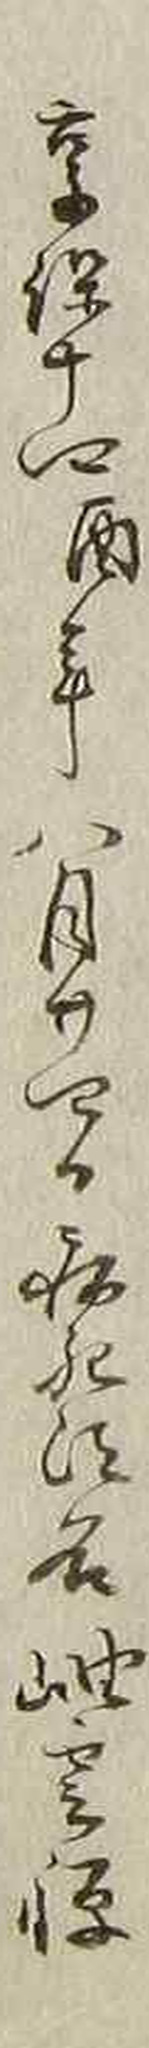享保十四酉年八月廿四日病死法名岫雲禅
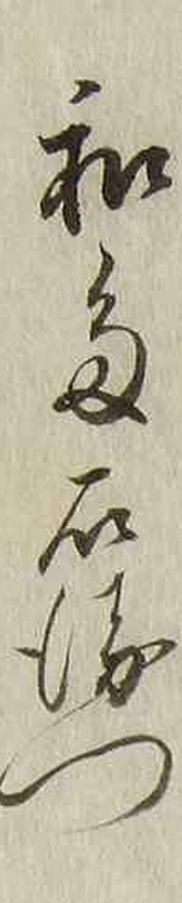和多右衛門
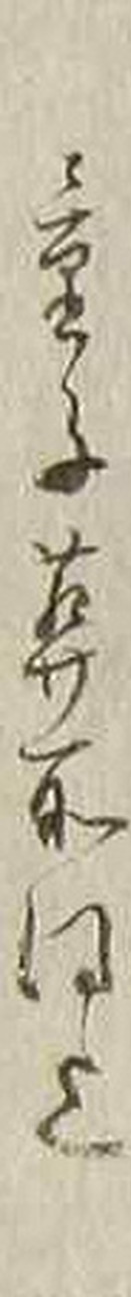童子葬所同上
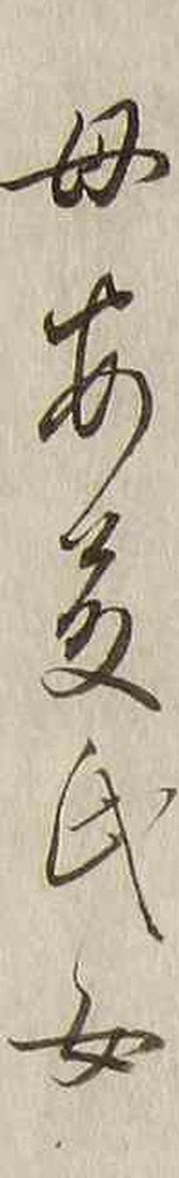母安藤氏女

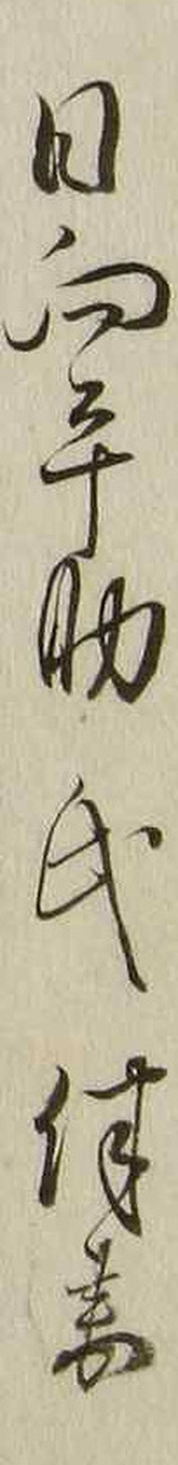女日向平助氏伴妻
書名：諸士系譜　巻之20　い之部20
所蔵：会津若松市立会津図書館
